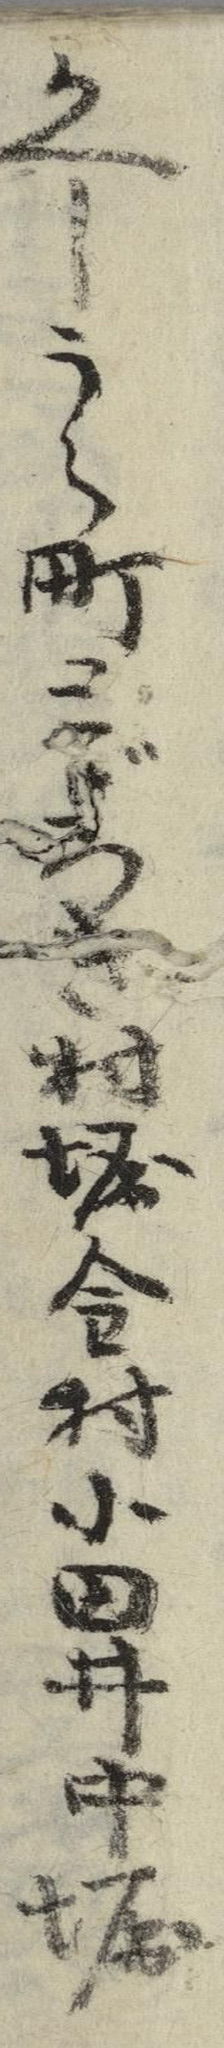かへしから町とゞろき村堀金村小田井中堀
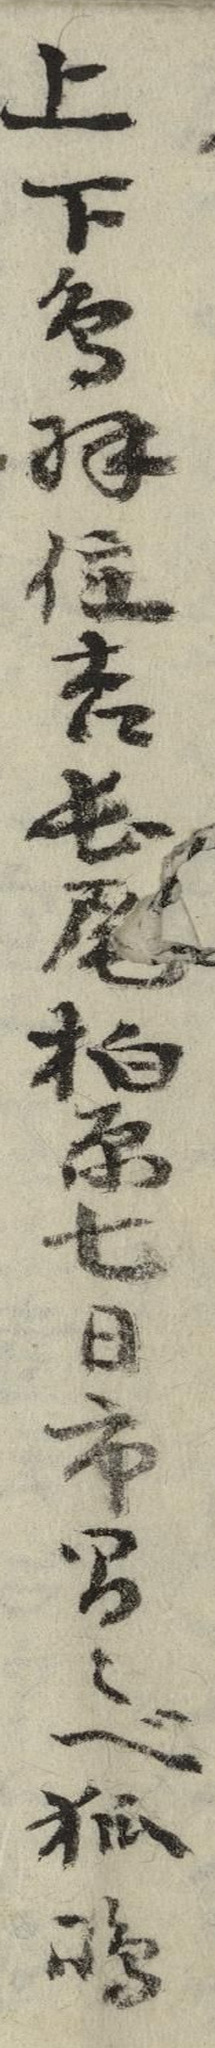上下鳥羽住吉長尾柏原七日市間々部狐嶋
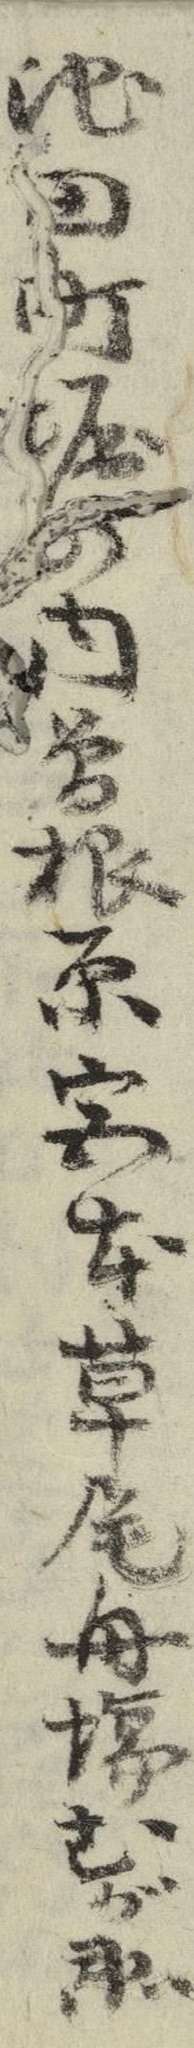池田町堀の内曽根原宮本草尾舟場むが衛
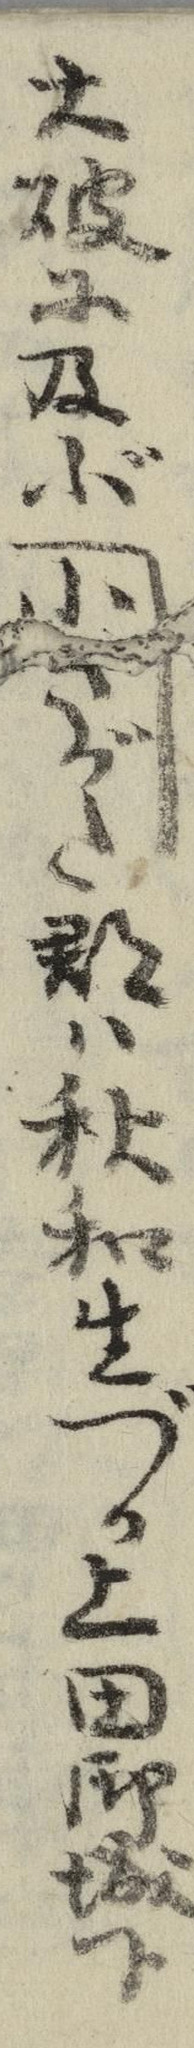大破に及ぶ小さがた郡ハ秋和生づか上田御城下
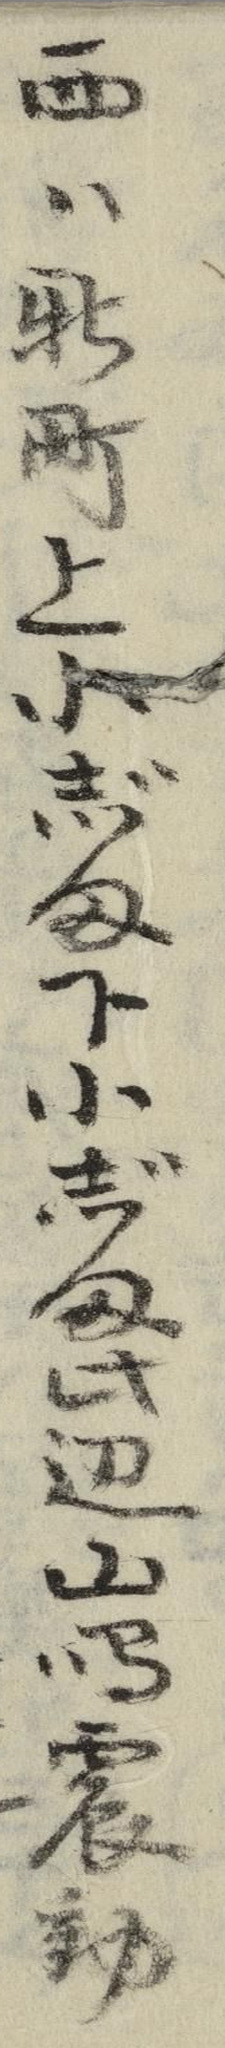西ハ新町上小じま下小じま此辺山鳴震動
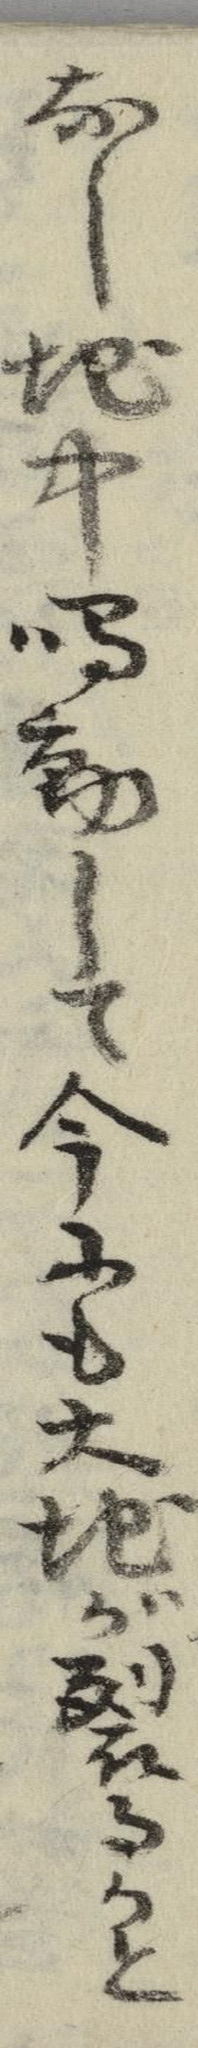なし地中鳴動して今にも大地が裂るかと
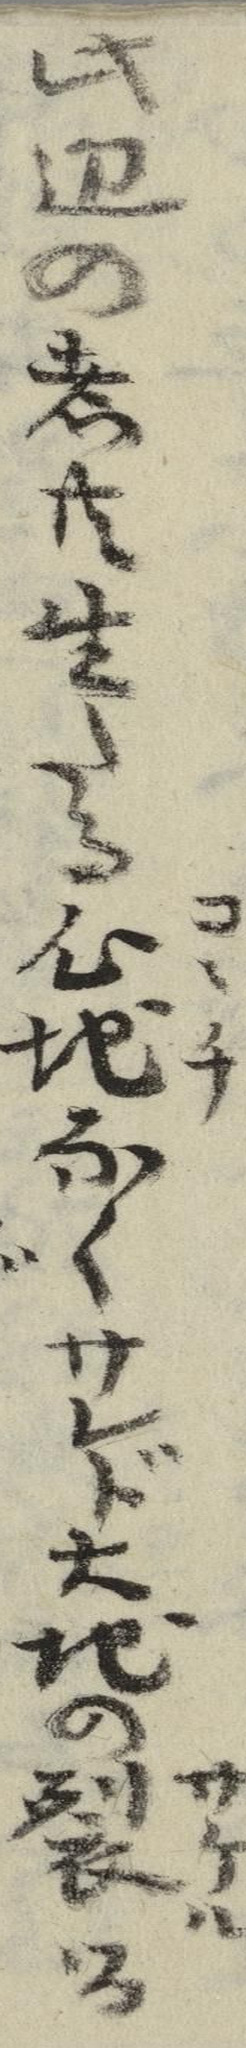此辺の者共生たる心地なくサレド大地の裂る
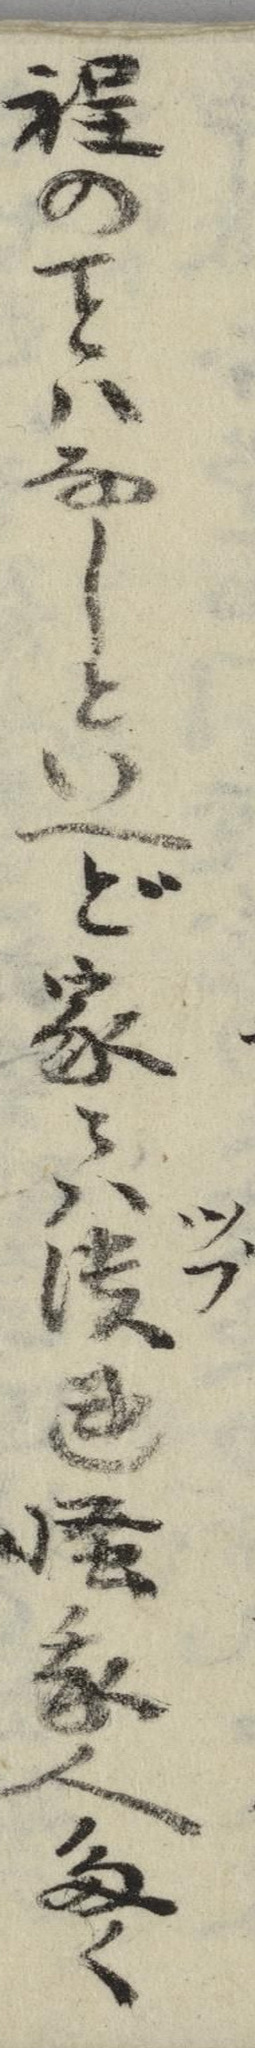程のことハなしといへど家々ハ潰れ怪我人多く
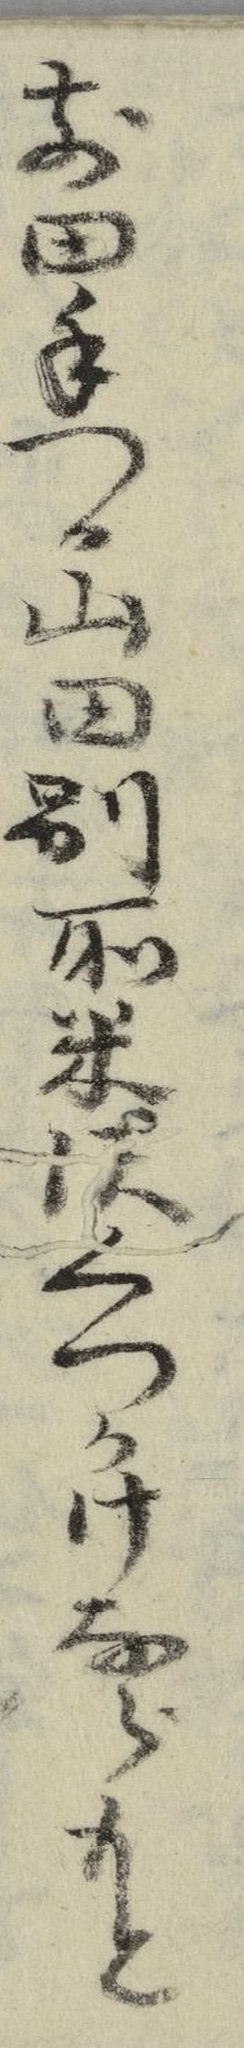前田手つか山田別所米沢くつかけならもと
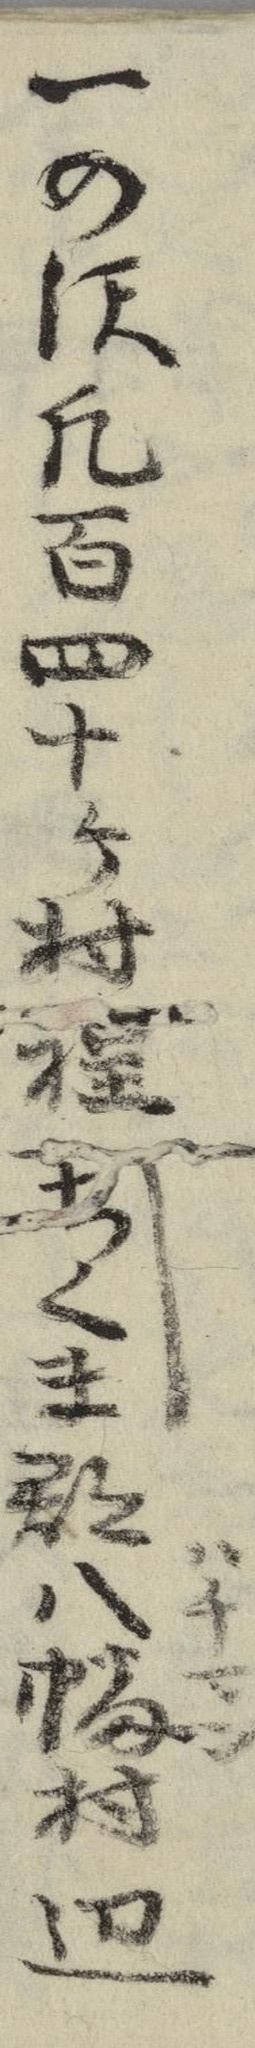一の沢凡百四十ヶ村程ちくま郡八幡村辺
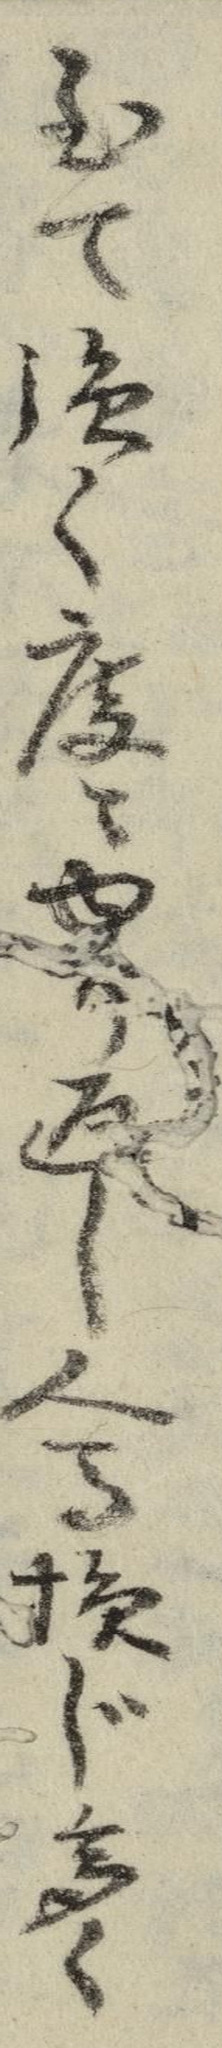至て強く度々ゆり返し人馬損じ多く
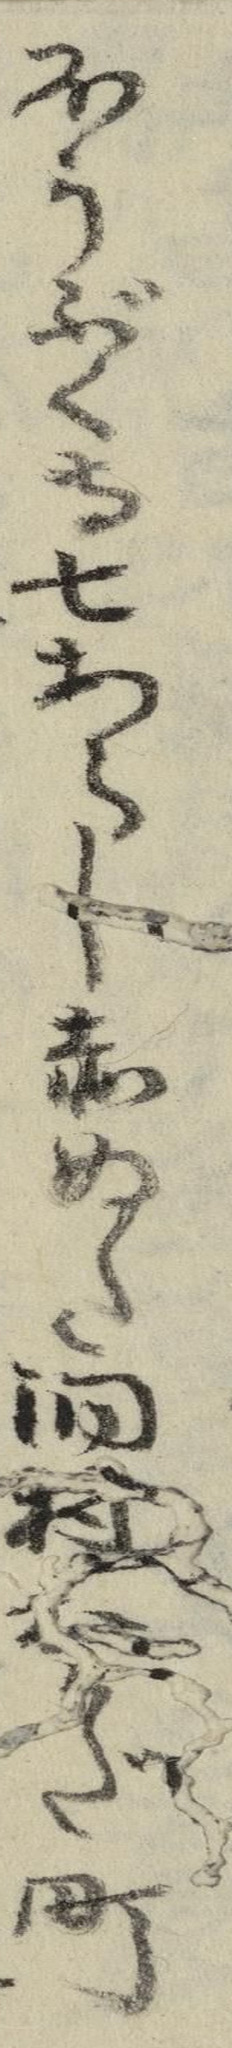ほうぶく寺七あらし赤ぬた洞おかだ町
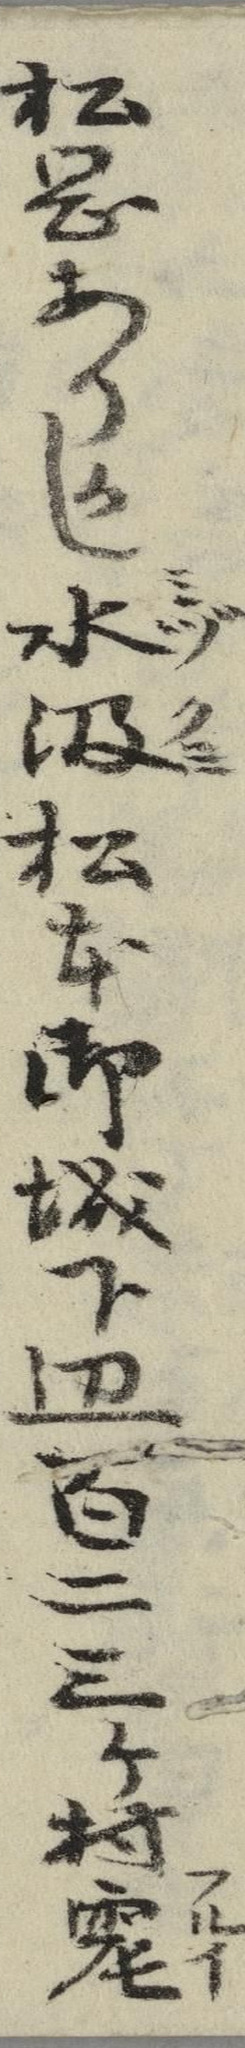松岡ありかし水汲松本御城下辺百二三ヶ村震
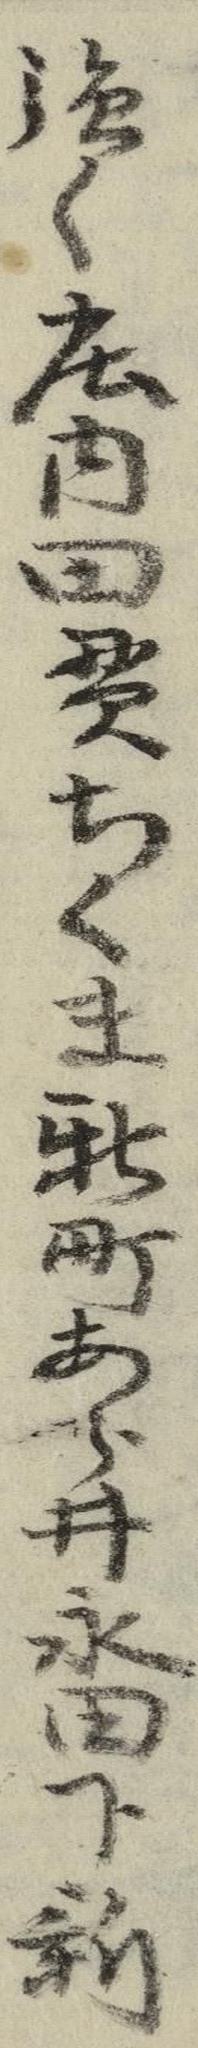強く庄内田貫ちくま新町あら井永田下新
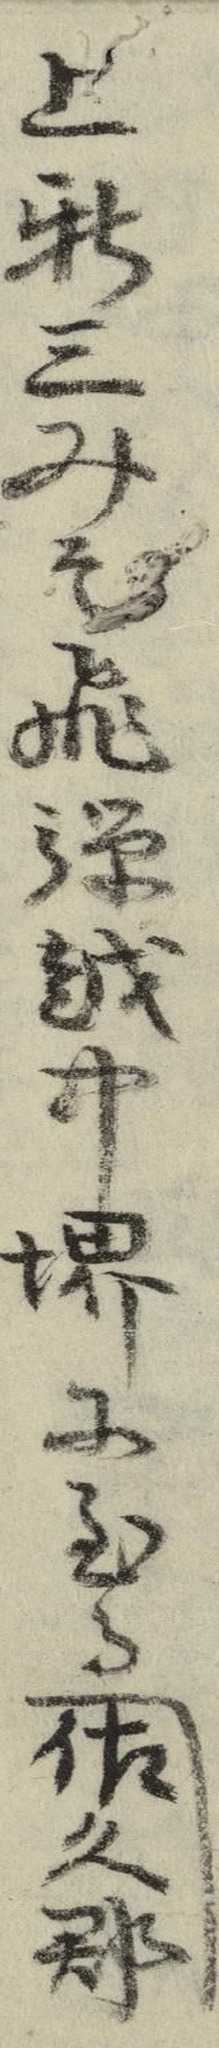上新三みそ飛騨越中堺に至る佐久郡
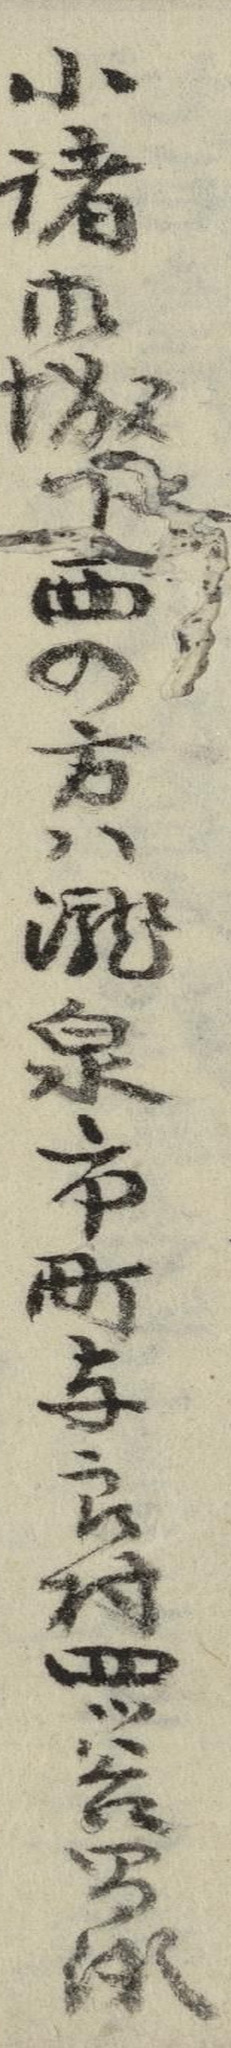小諸御城下西の方ハ瀧泉市町与良村四ッ谷間瀬
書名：信州大地震一件之冩　丁未弘化四年三月吉日
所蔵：東京大学地震研究所図書室 Earthquake Research Institute Library, The University of Tokyo, JAPAN
